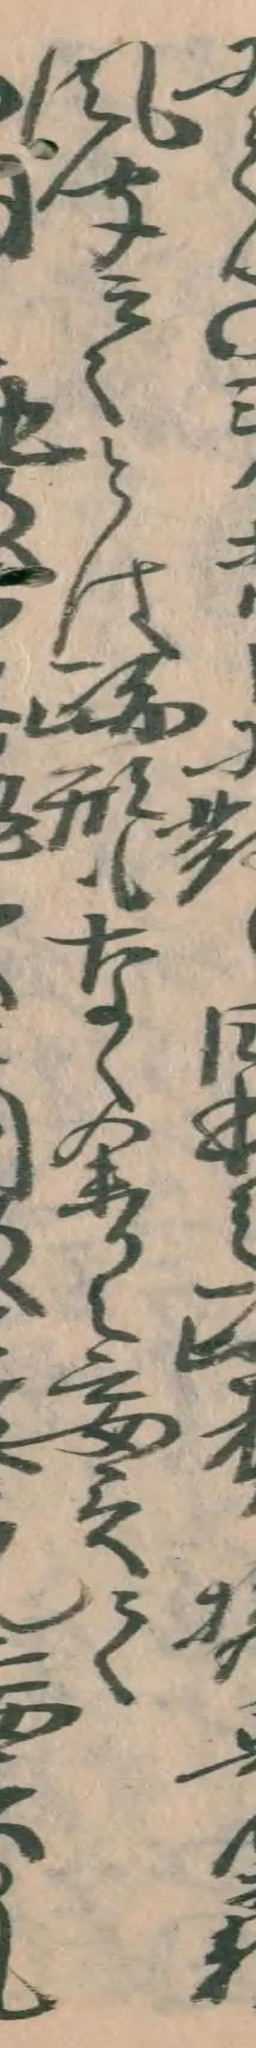風聞云々とは跡形もなく余り之妄言ニ候
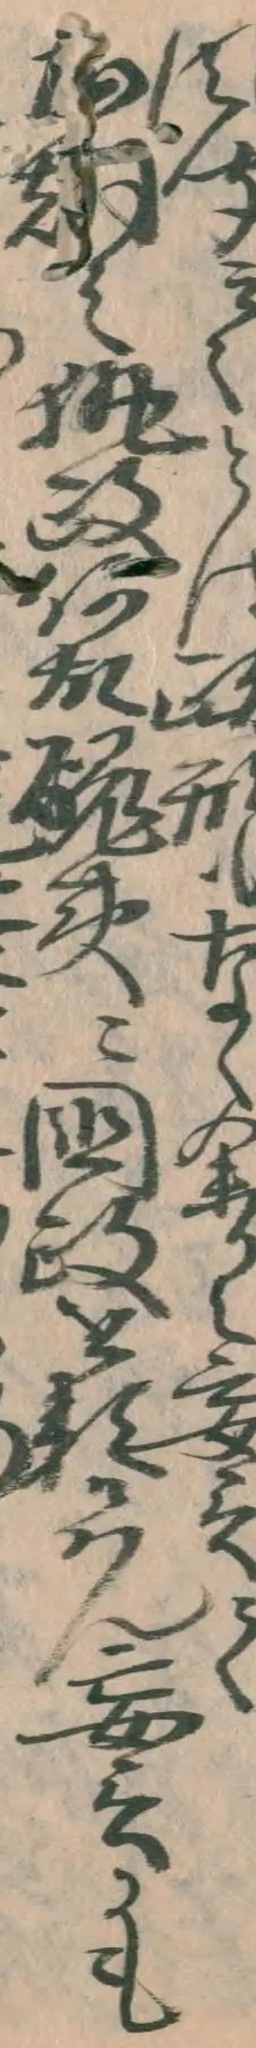本朝之執政何故醜夷ニ国政を頼候ハん妄言にも
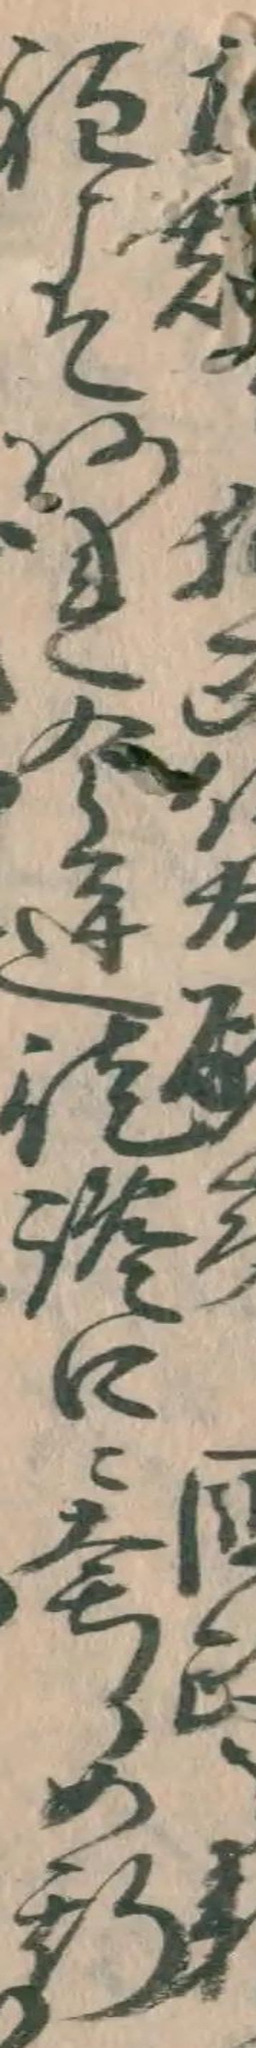程にてあれ今逆徒讒口ニ奢り如斯
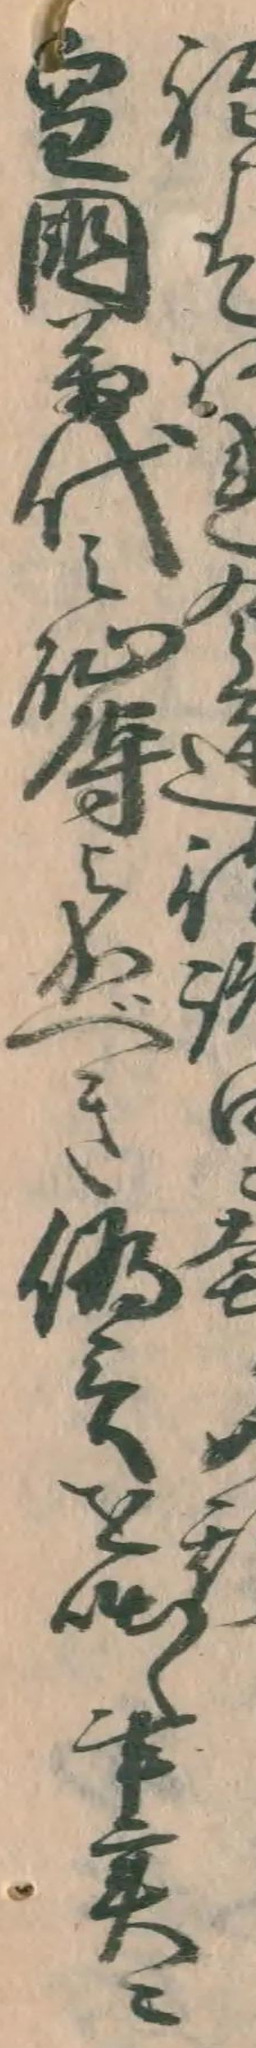皇国萬代之恥辱と成べき偽言を咄候事実ニ
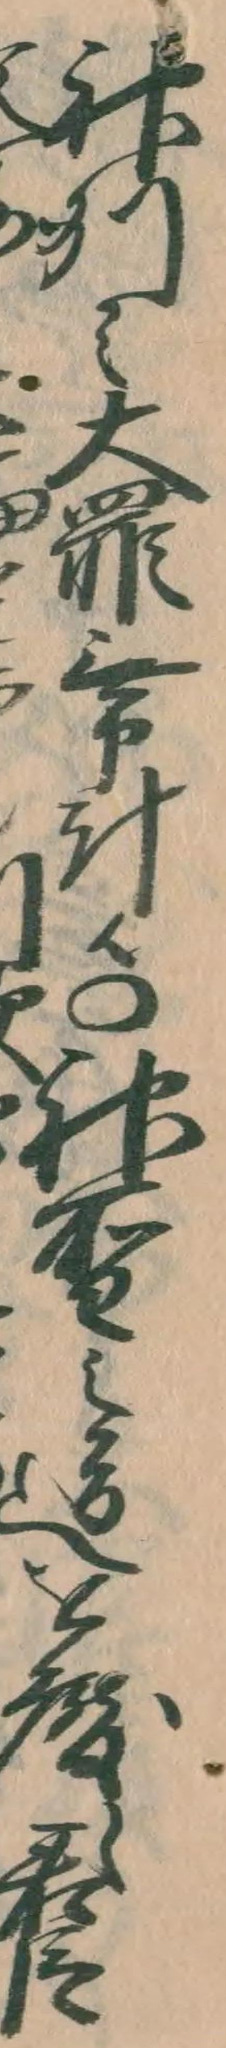神州之大罪無申計候〇神聖之道を廃し君臣
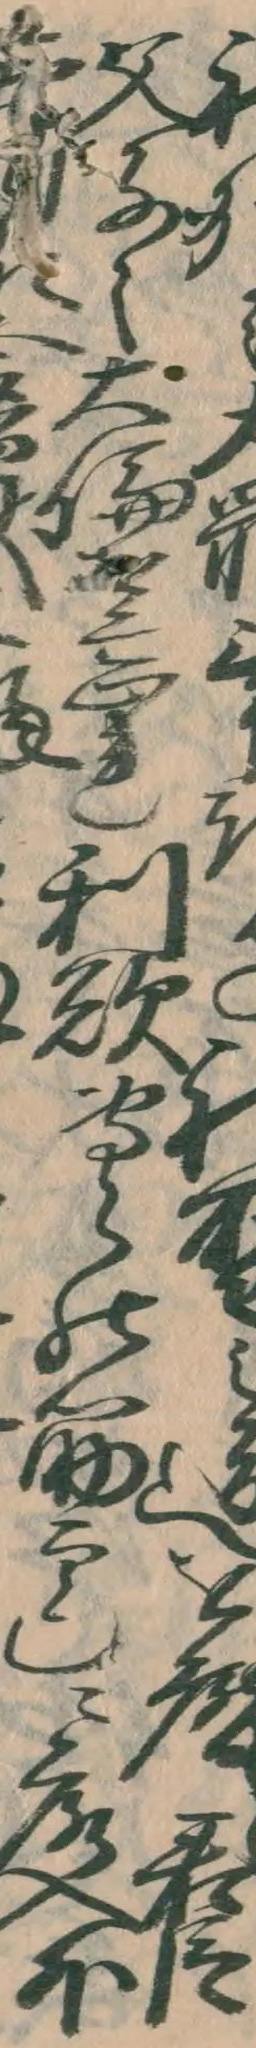父子之大倫を忘れ也利欲専らの筋而已ニ落入外
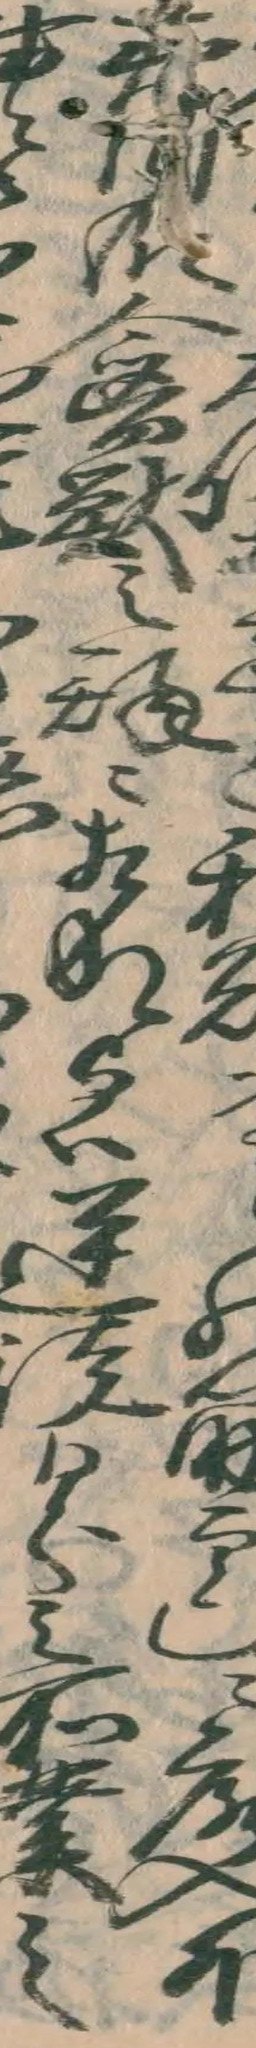夷同様禽獣之群ニ相成候とハ逆徒自分之所業之
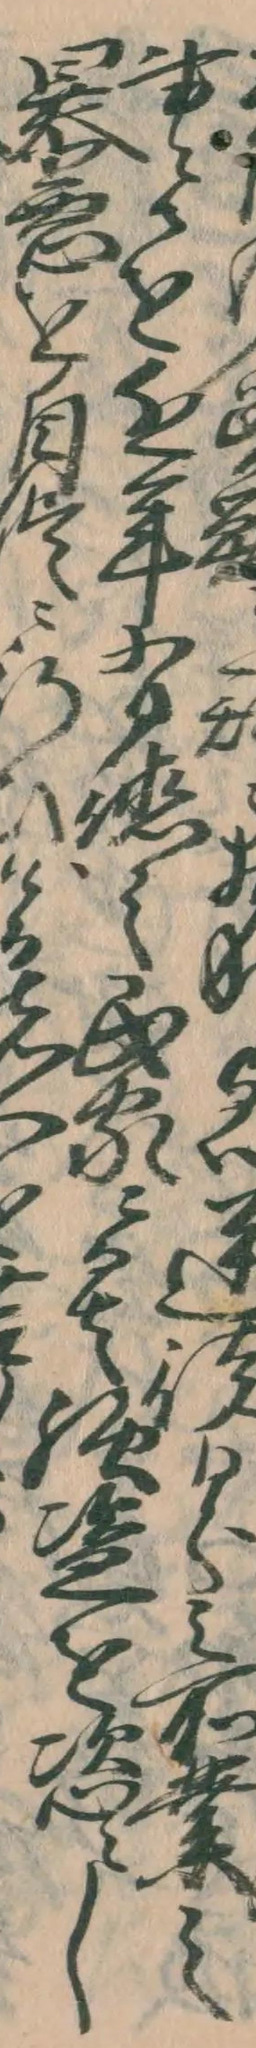事ニ候を近年有徳之民家ニ而者強盗を恣ニし
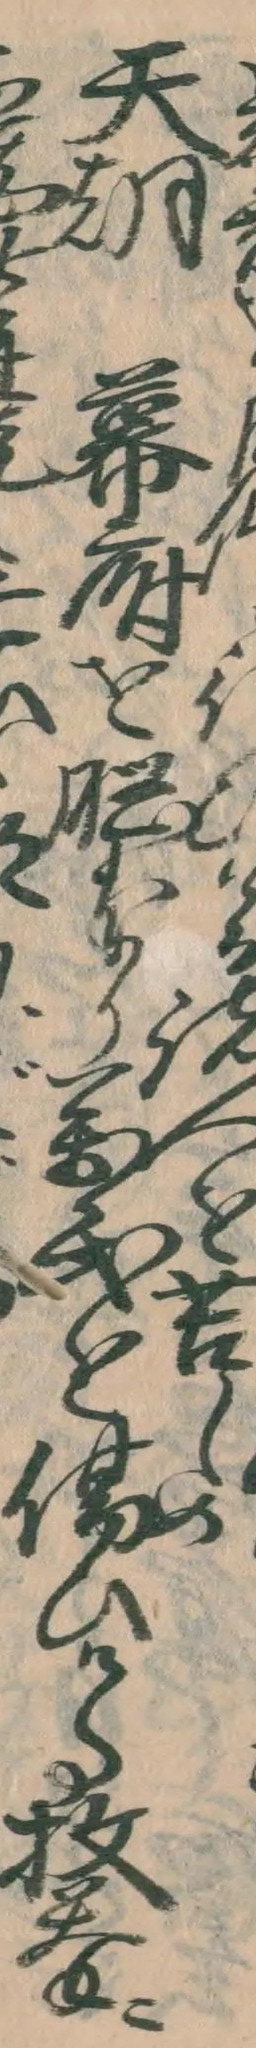天朝幕府を腦奉り萬人を傷ひ候事枚挙ニ
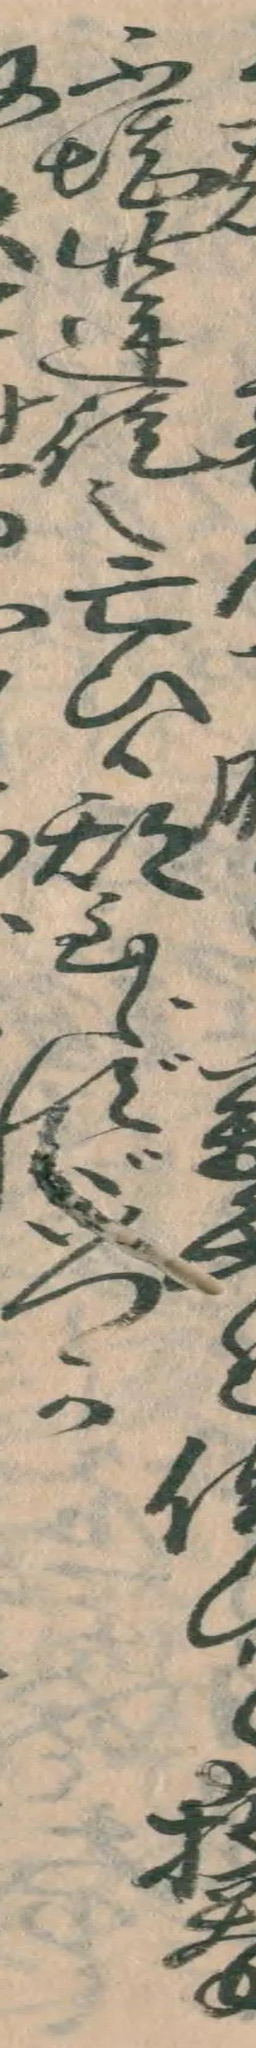不堪此逆徒之亡ひ候期至らずバいつか
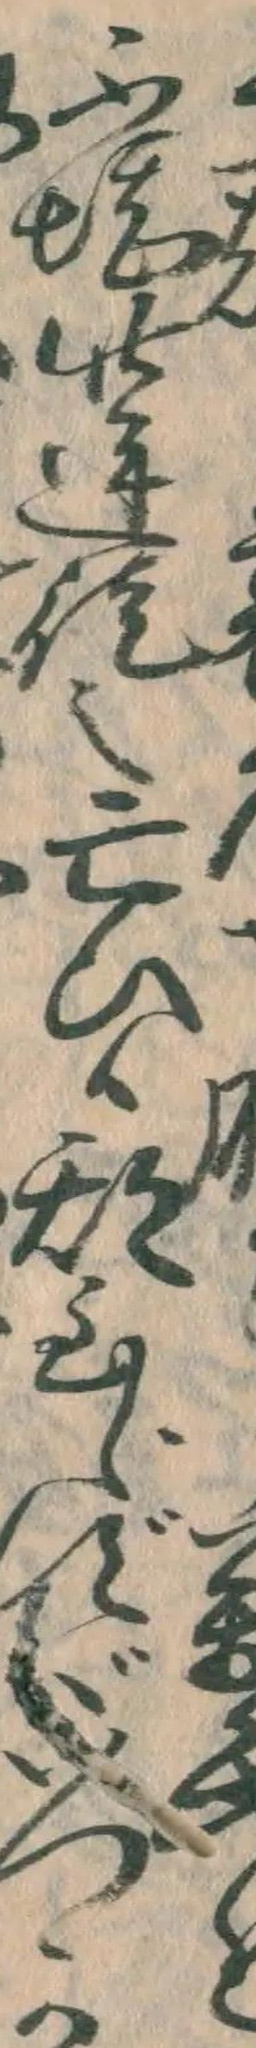不堪此逆徒之亡ひ候期至らずバいつか
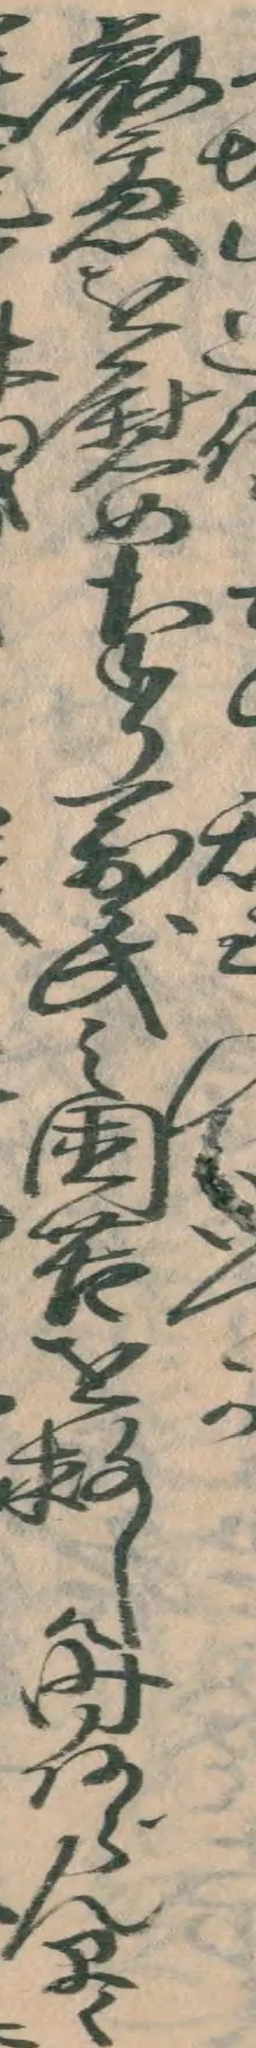叡慮を慰め奉り萬民の困苦を救し候時あらん早く
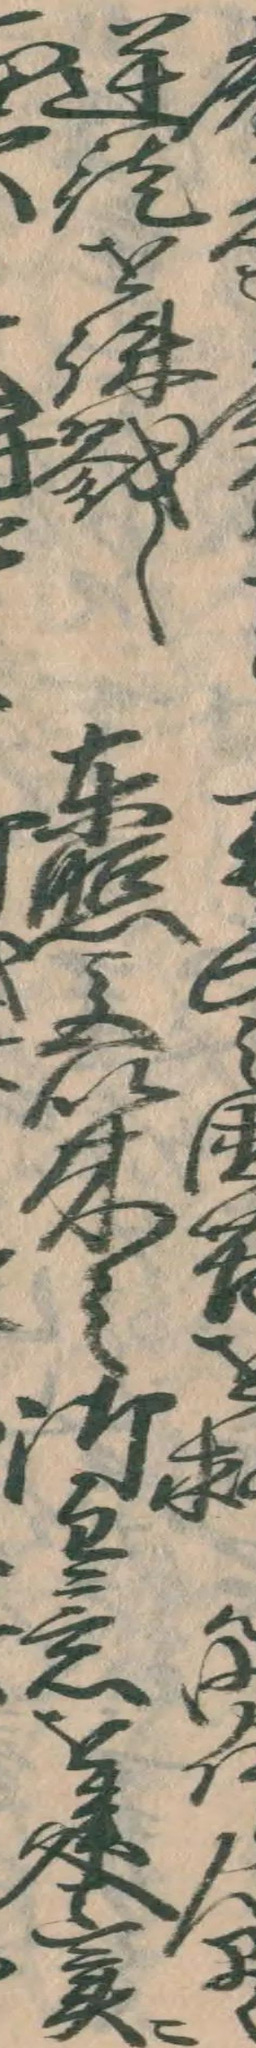逆徒を誅戮し東照宮以来之御主意を建真実ニ
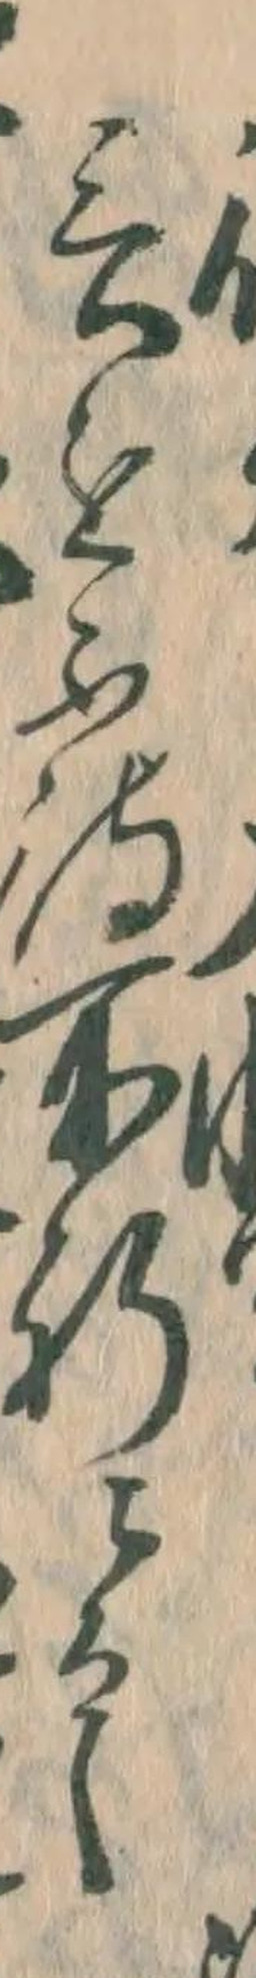言を不待所祈ニ而候
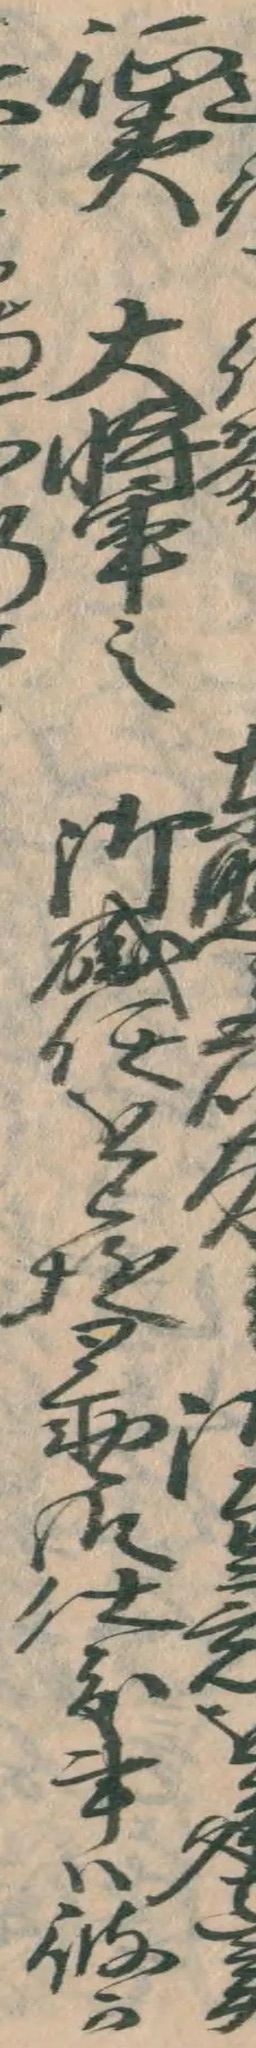征夷大将軍之御職任を被遊御勤候様仕度事ハ彼か
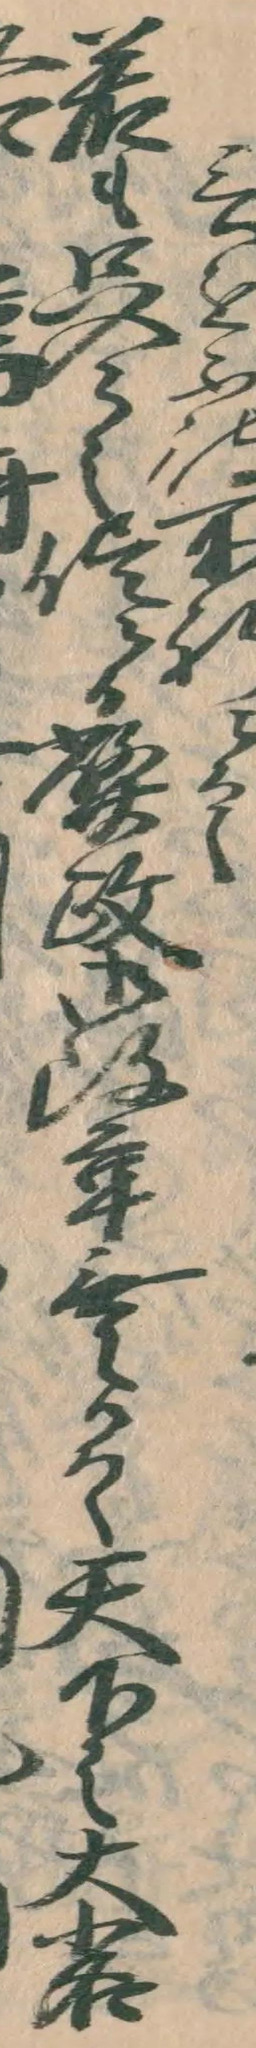若も只今之侭ニ而弊政御改革無之候ハヽ天下之大小名
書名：麗斎叢書. 20
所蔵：国立国会図書館 National Diet Library, JAPAN
